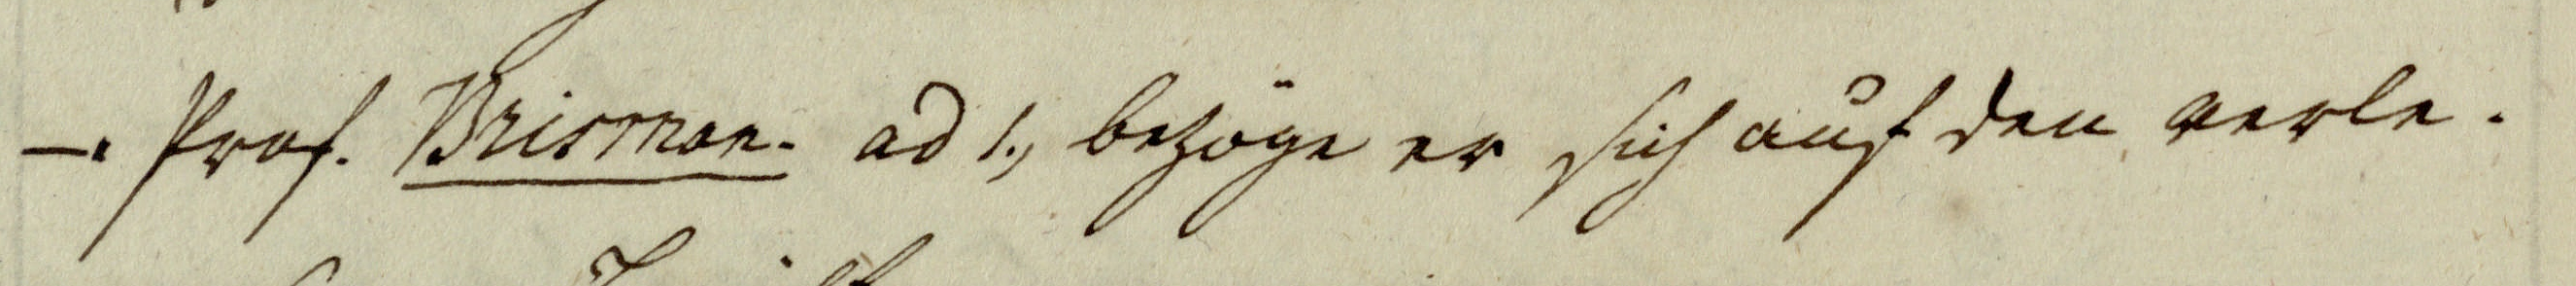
Prof. Brisman. ad 1., bezöge er sich auf den verle¬
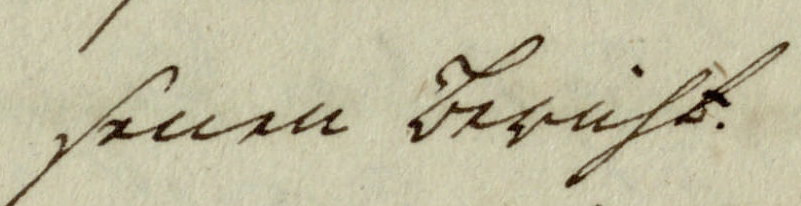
senen Bericht.
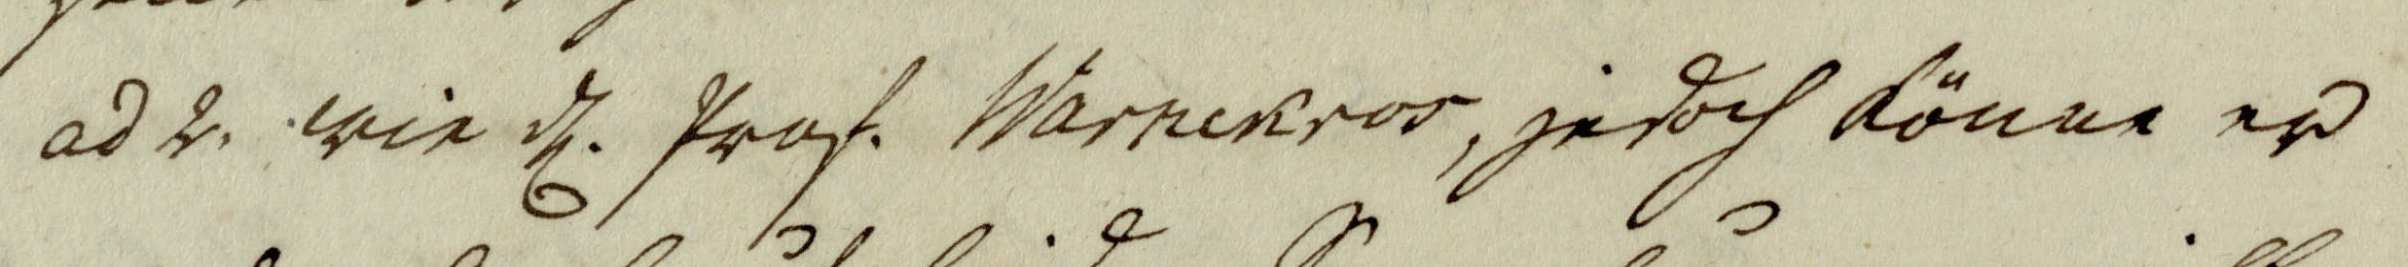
ad 2. wie dh. Prof. Warnekros, jedoch könne er
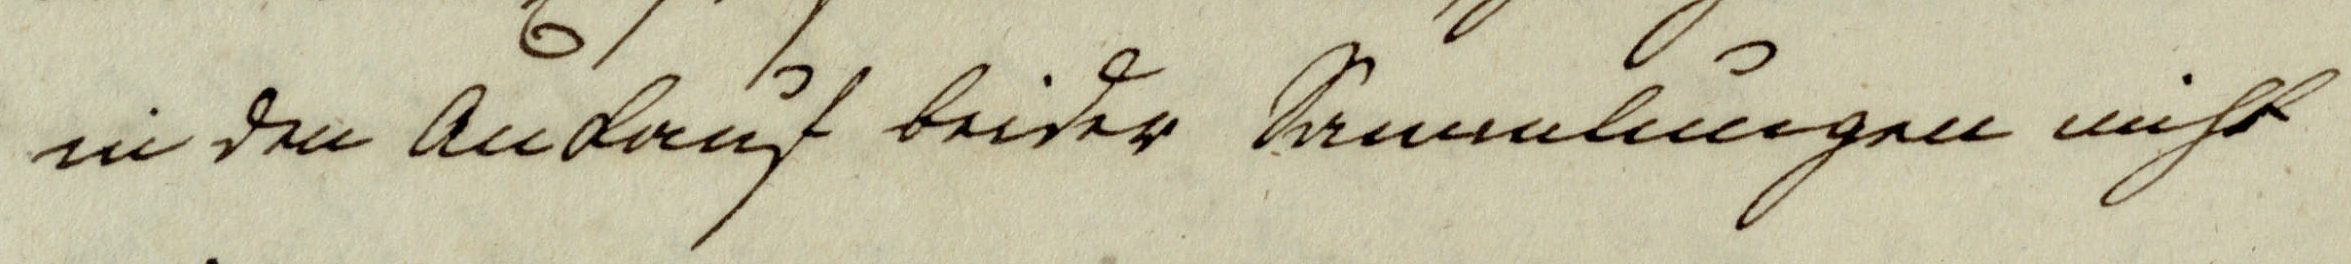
in den Ankauf beider Sammlungen nicht
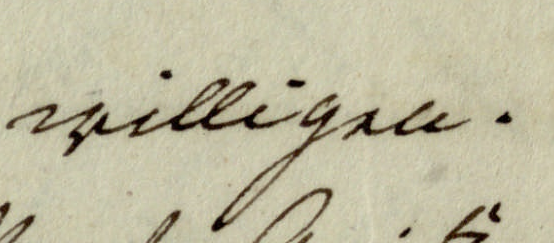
willigen.
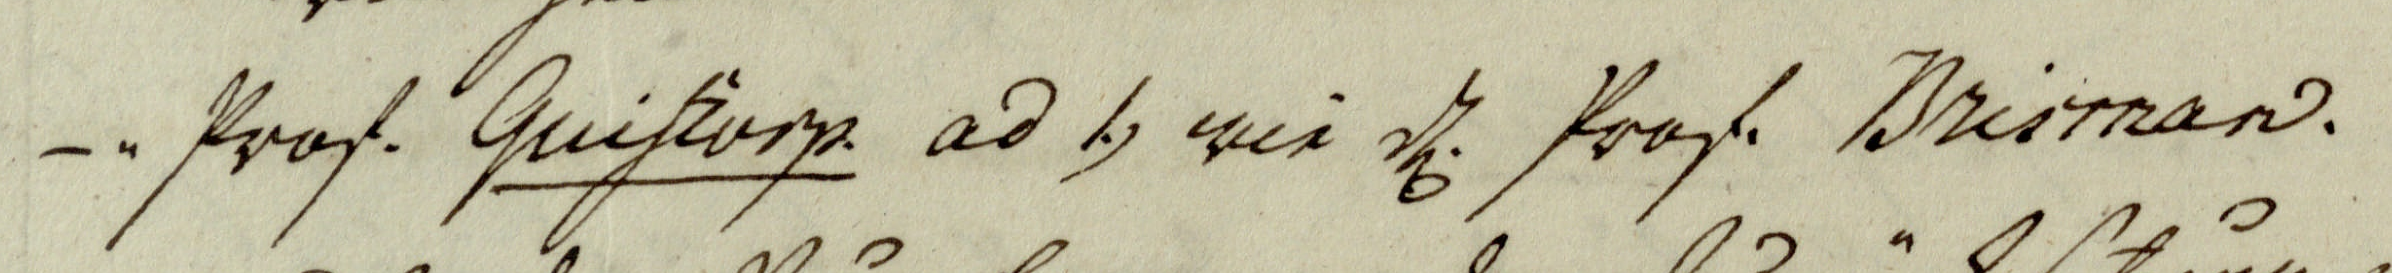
Prof. Quistorp. ad 1., wie dh. Prof. Brisman.
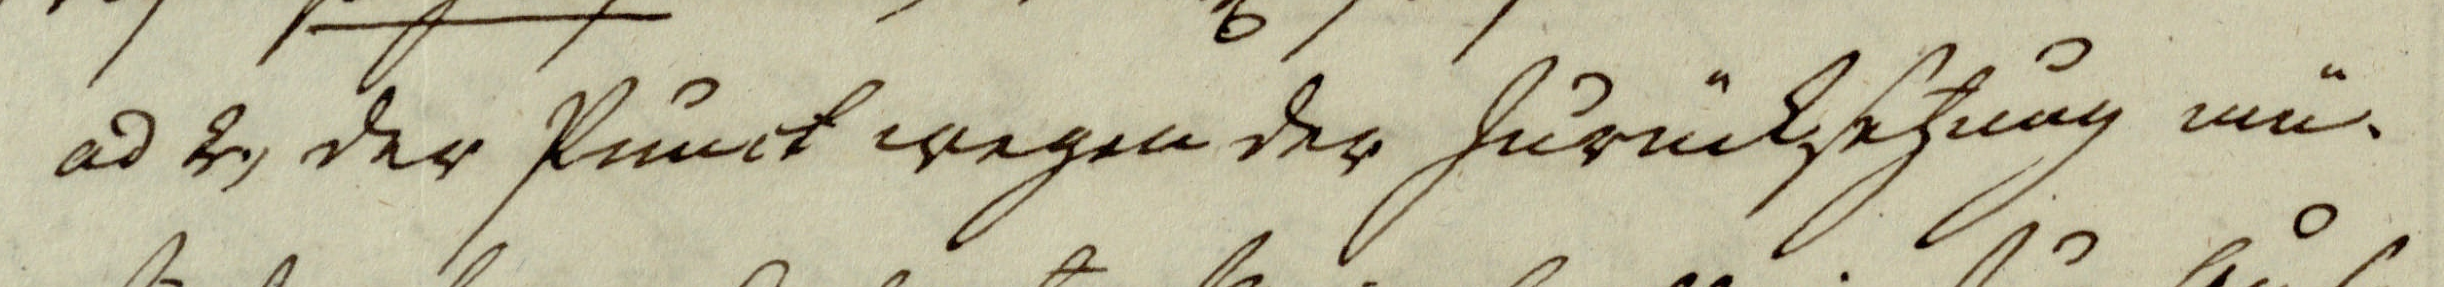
ad 2., der Punct wegen der Zurücksetzung mü¬
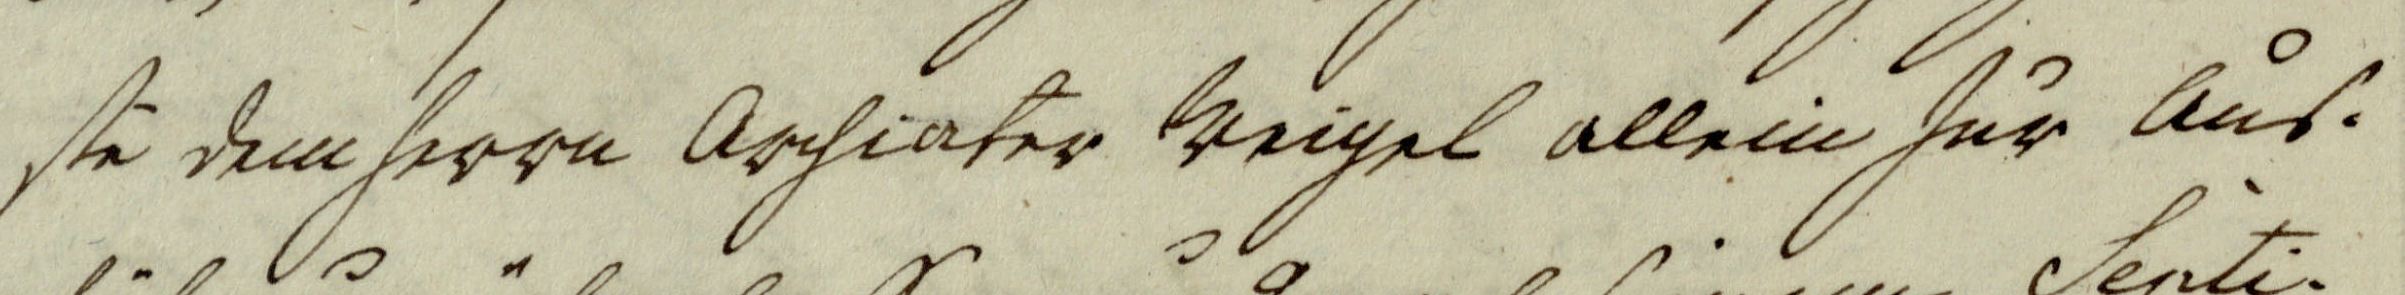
ste dem Herrn Archiater Weigel allein zur Aus¬
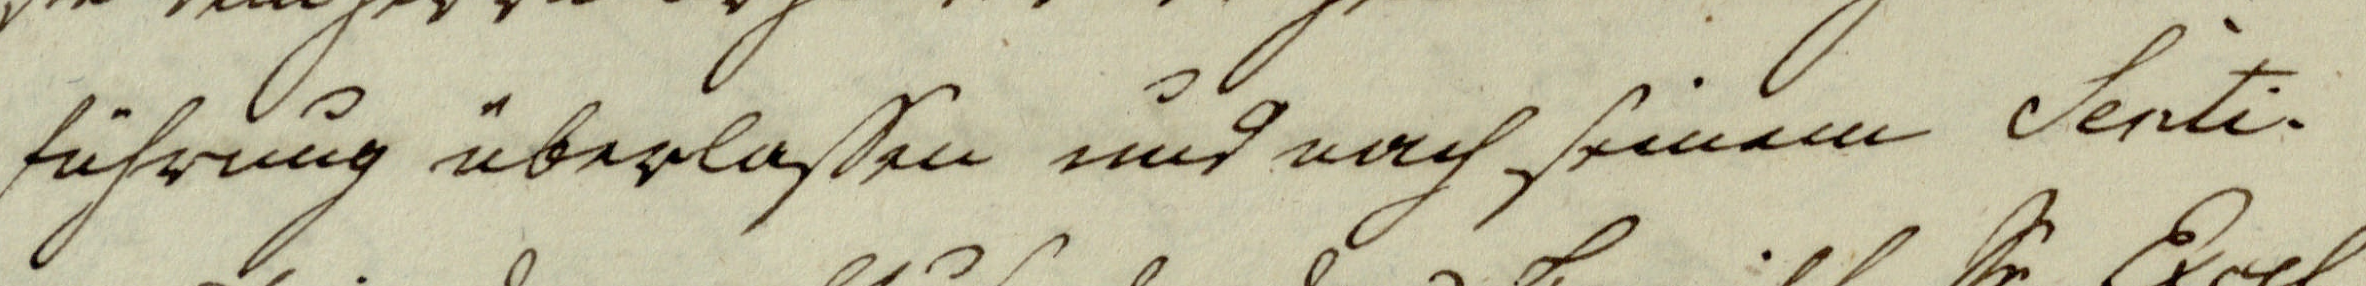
führung überlassen und nach seinem Senti¬
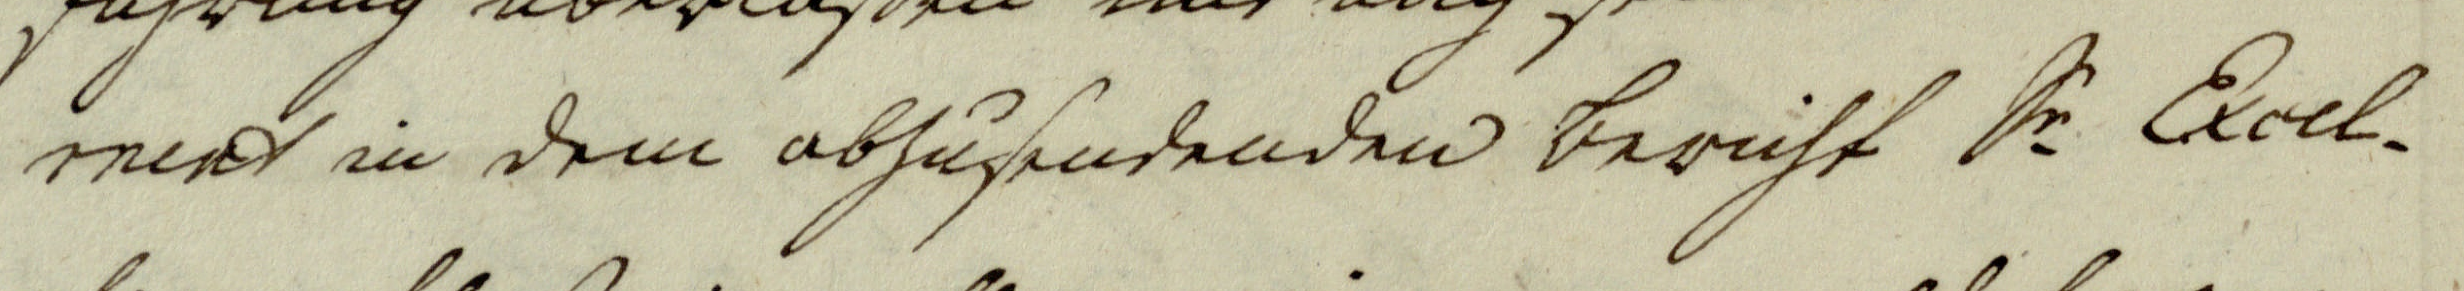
ment in dem abzusendenden Bericht Sr Excel¬
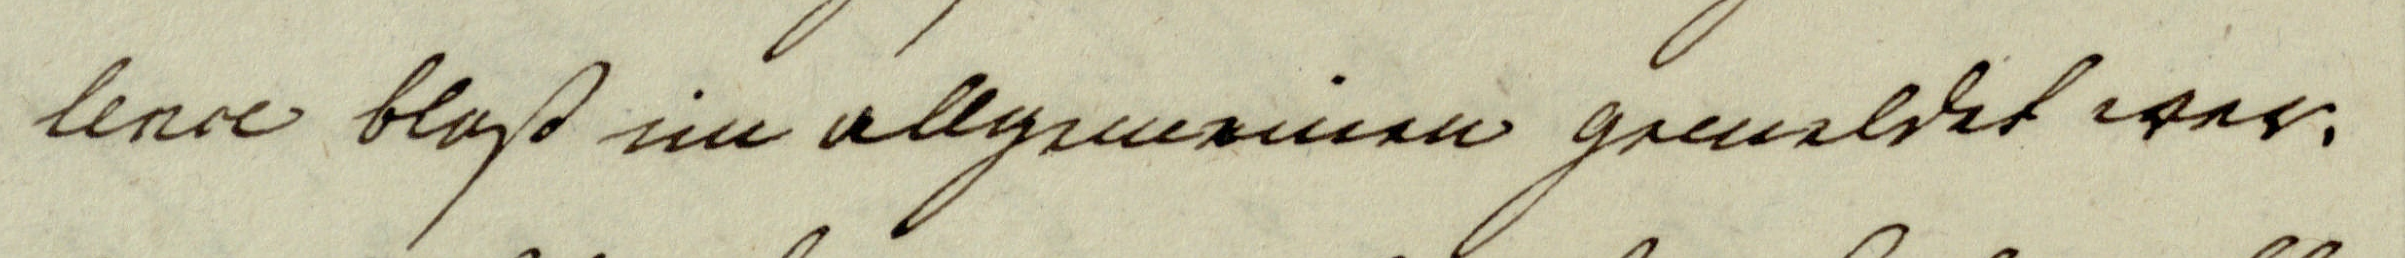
lence bloß im allgemeinen gemeldet wer¬
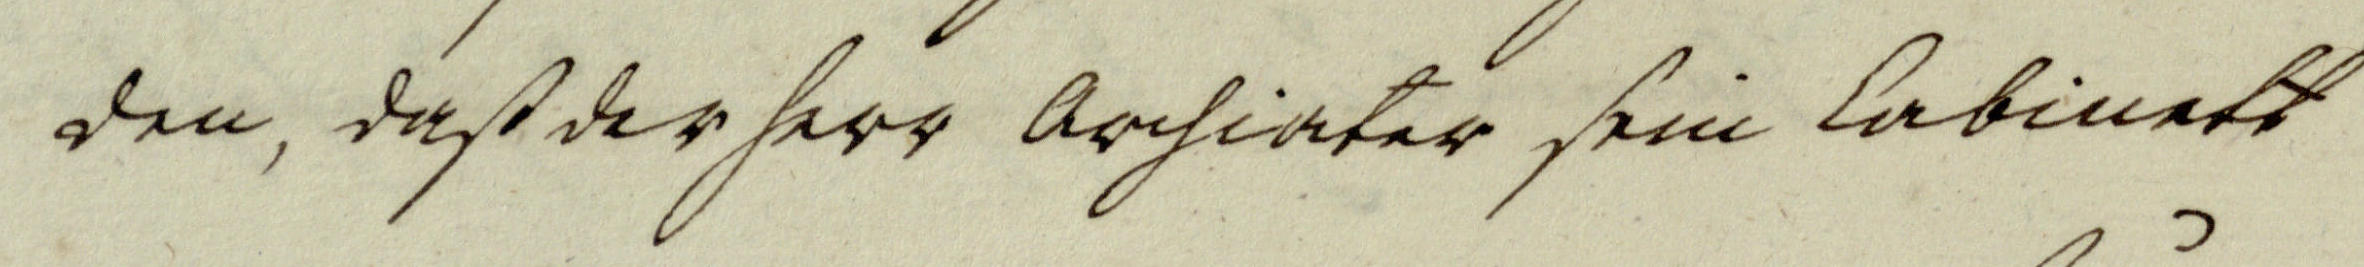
den, daß der Herr Archiater sein Cabinett
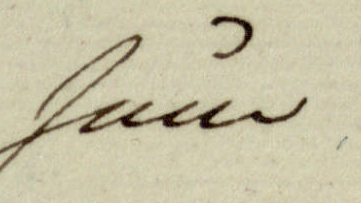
zum
